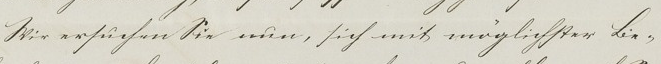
Wir ersuchen Sie nun, sich mit möglichster Be-
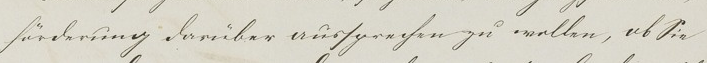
förderung darüber aussprechen zu wollen, ob Sie
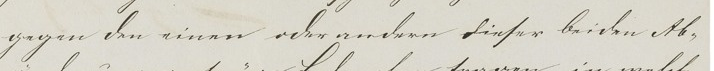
gegen den einen oder andern dieser beiden Ab-
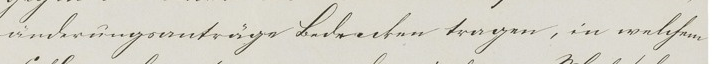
änderungsanträge Bedenken tragen, in welchem
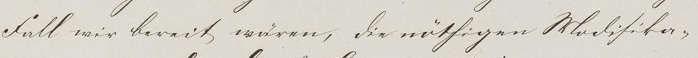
Fall wir bereit wären, die nöthigen Modifika-
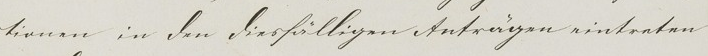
tionen in den diesfälligen Anträgen eintreten
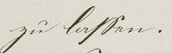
zu lassen.
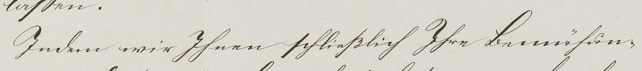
Indem wir Ihnen schließlich Ihre Bemühun-
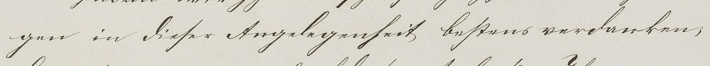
gen in dieser Angelegenheit bestens verdanken,
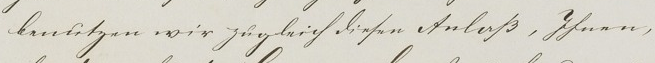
benutzen wir zugleich diesen Anlaß, Ihnen,
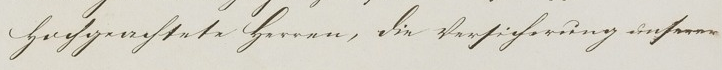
Hochgeachtete Herren, die Versicherung unserer
